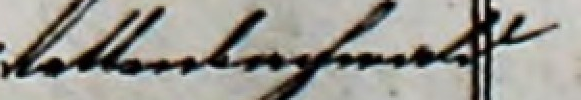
Rettenbachwald
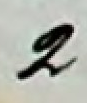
2
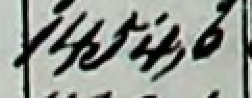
1454,6
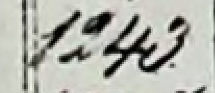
1243
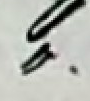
„
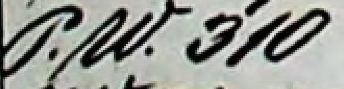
P.W. 310
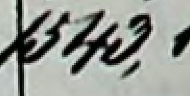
1543,1
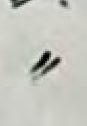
„
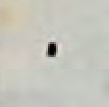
„
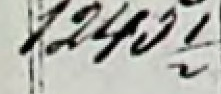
1245 1/2
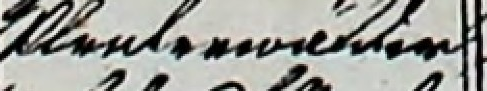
Plenterwälder
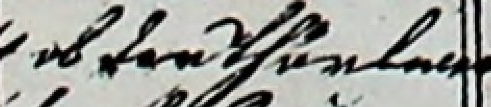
ob den Thorleis„
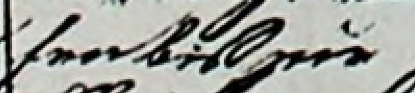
sen bis zur
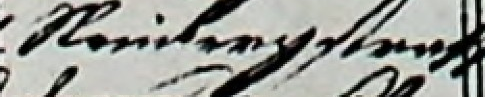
Steinbergstraff
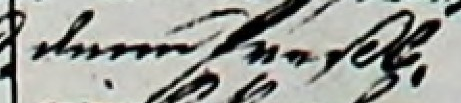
dann Preßl„
